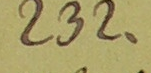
232
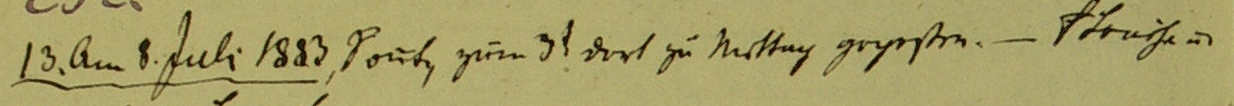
13) Am 8. Juli 1883, Sonntag, zum 3-ten mal dort Mittag gegeßen.- Mit Louise und
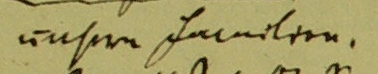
unseren Familien.
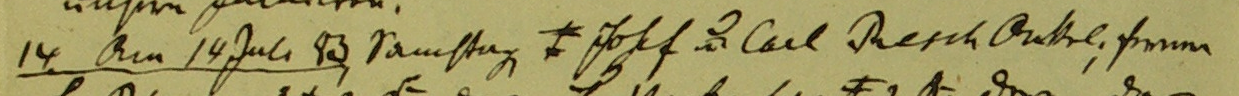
14) Am 14. Juli 83, Sonntag. Mit Josef und Carl Resch Onkel; ferner
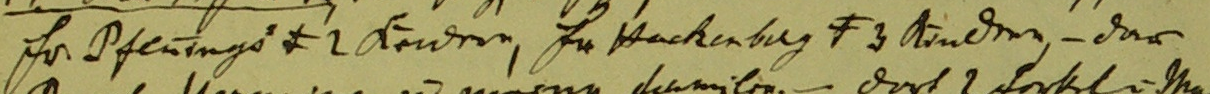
Frau Pfenniges mit 2 Kindern, Fr. Hackerberg mit 3 Kindern,-- Dann
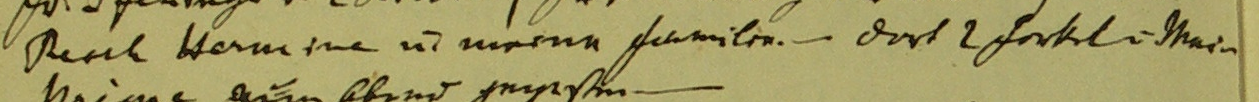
Resch Hermine und unsere Familien.- dort 2 Ferkel und Mai¬
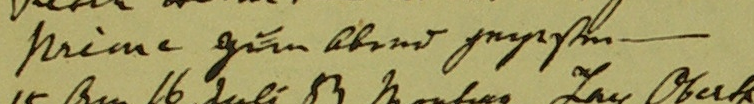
kreme zum Abend gegeßen.—
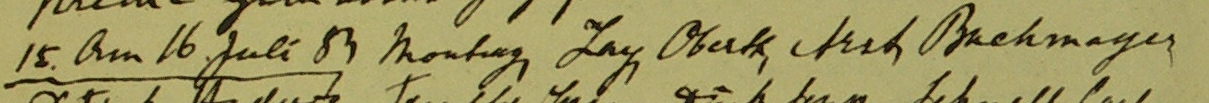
15) Am 16. Juli 83, Montag, Lay Oberth, Aret Brehmages,
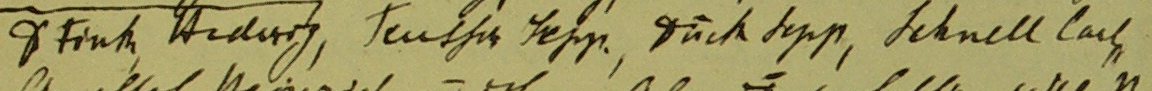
Dr. Fink Hedwig, Teutsch Sepp, Dück Sepp, Schnell Carl,
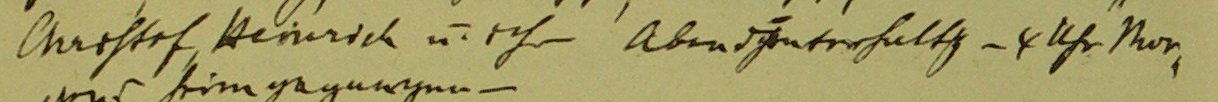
Christof, Heinrich und ich. Abendunterhaltung- 4 Uhr mor¬
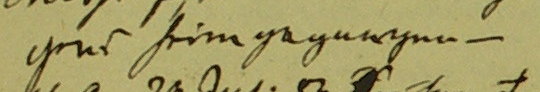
gens heimgegangen.—
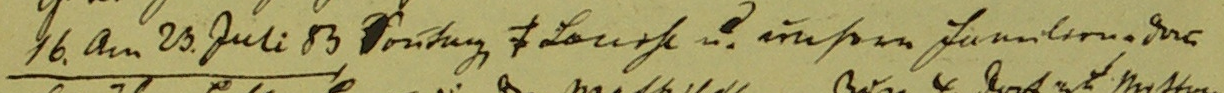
16) Am 23. Juli 83 Sonntag. Mit Louise und unseren Familien Dann
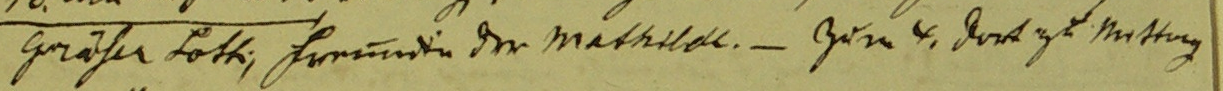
Gräser Lotti, Freundin der Mathilde.- Zum 4. dort zu Mittag
